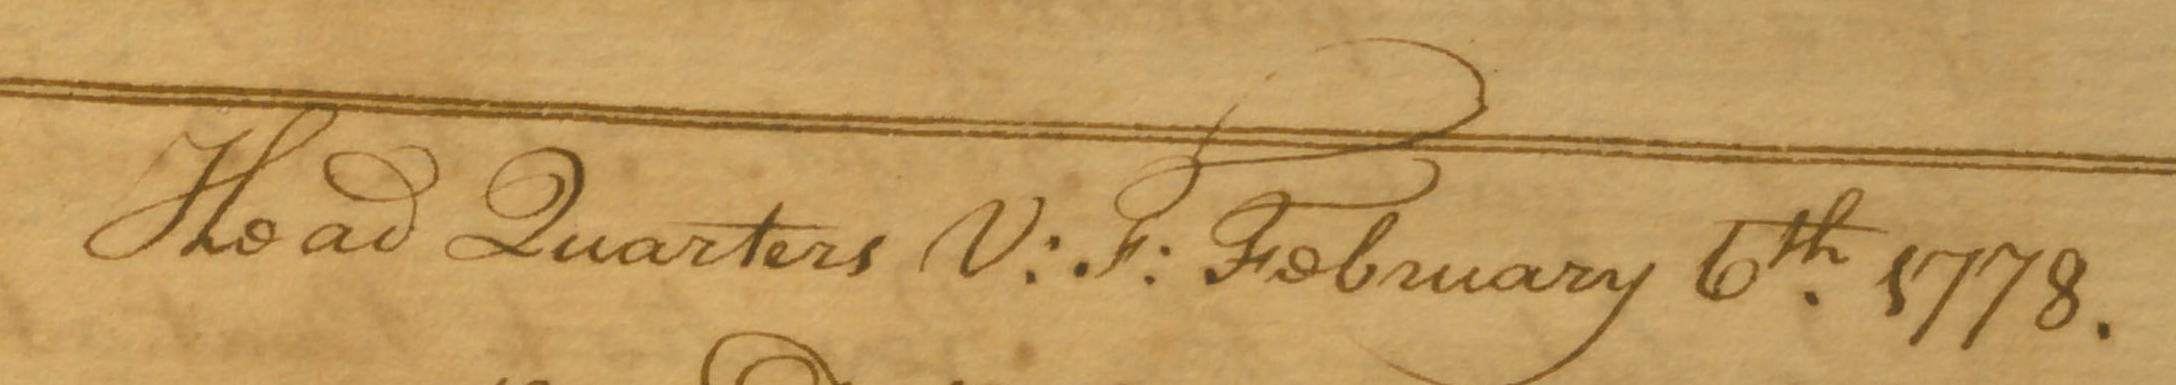Head Quarters V: F: February 6^th. 1778.
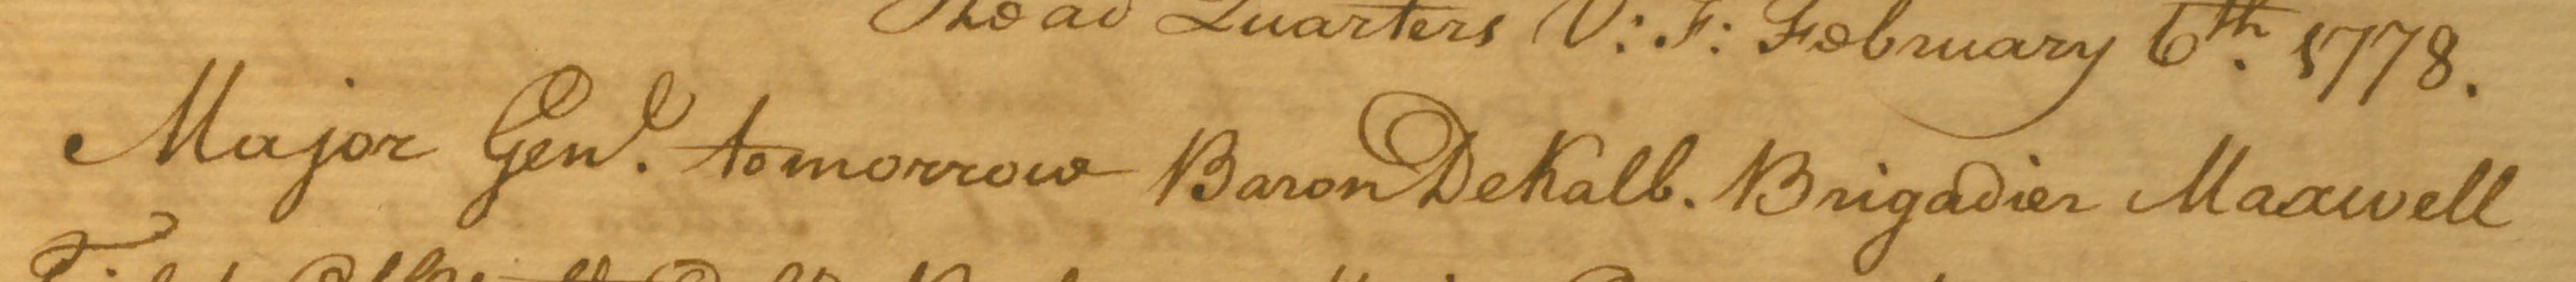Major Gen^l. tomorrow Baron DeKalb. Brigadier Maxwell
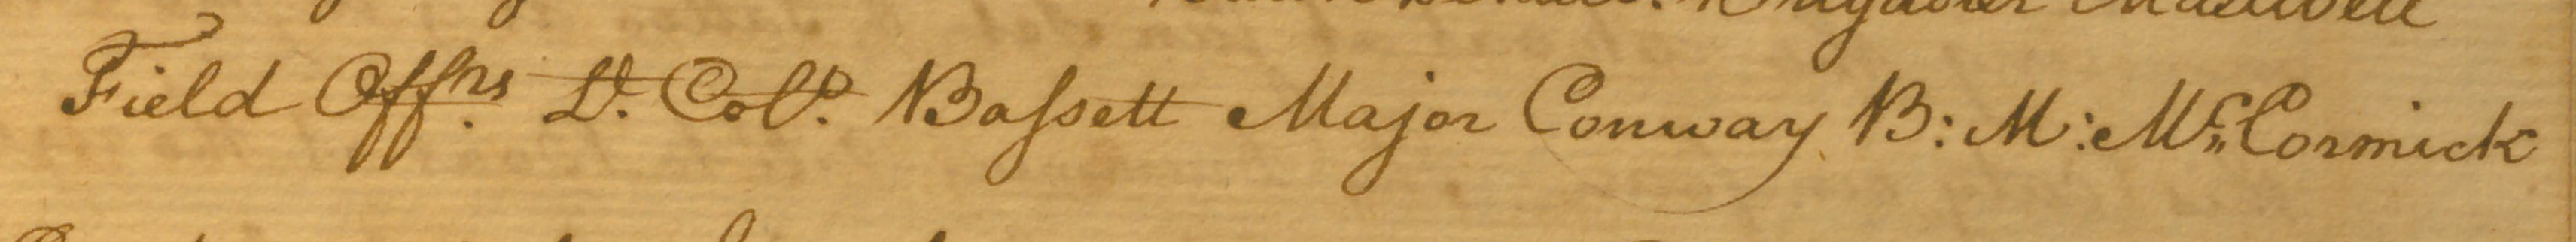Field Off^rs. L^t. Col^o. Bassett Major Conway B: M: M^c.Cormick
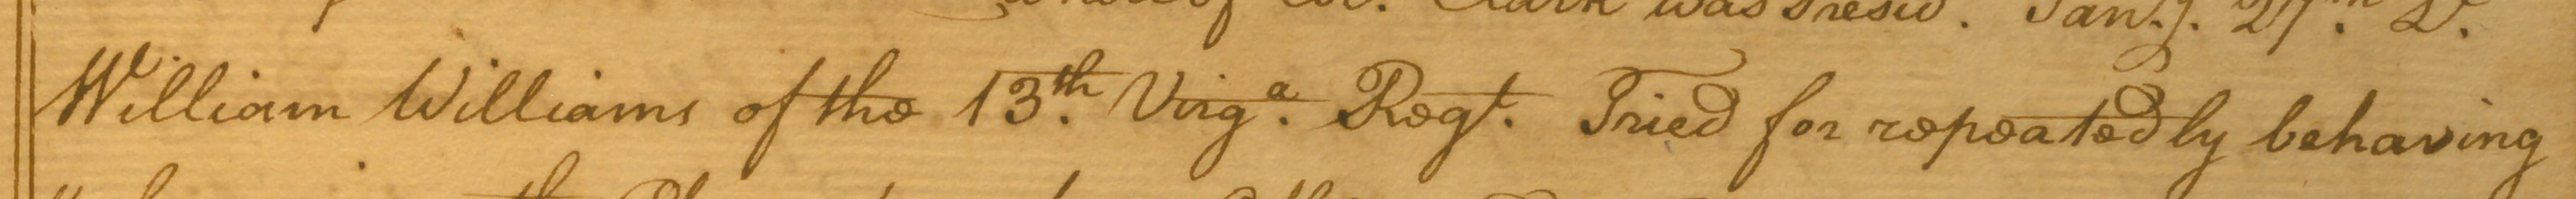William Williams of the 13^th. Virg^a. Reg^t. for repeatedly behaving
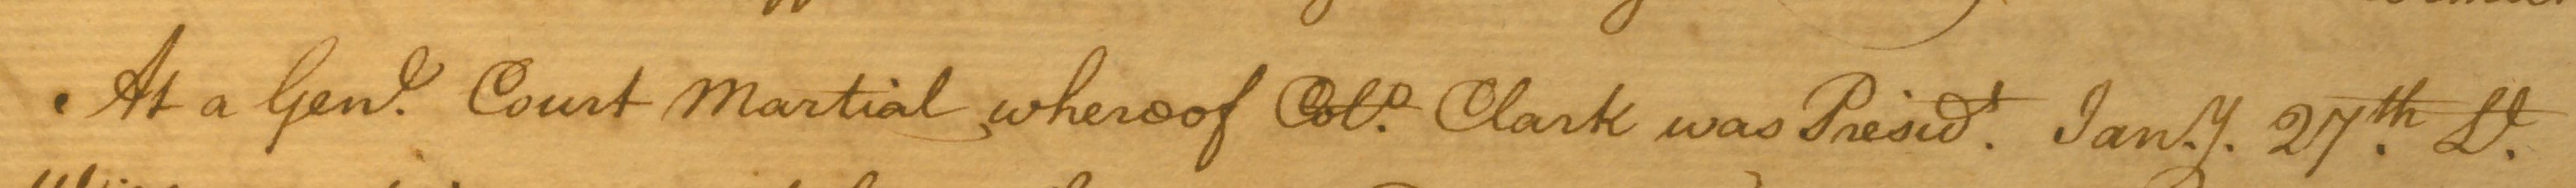As a Gen^l. Court Martial whereof Col^o. Clark was Presid^t. Jan^y. 27^th. L^t.
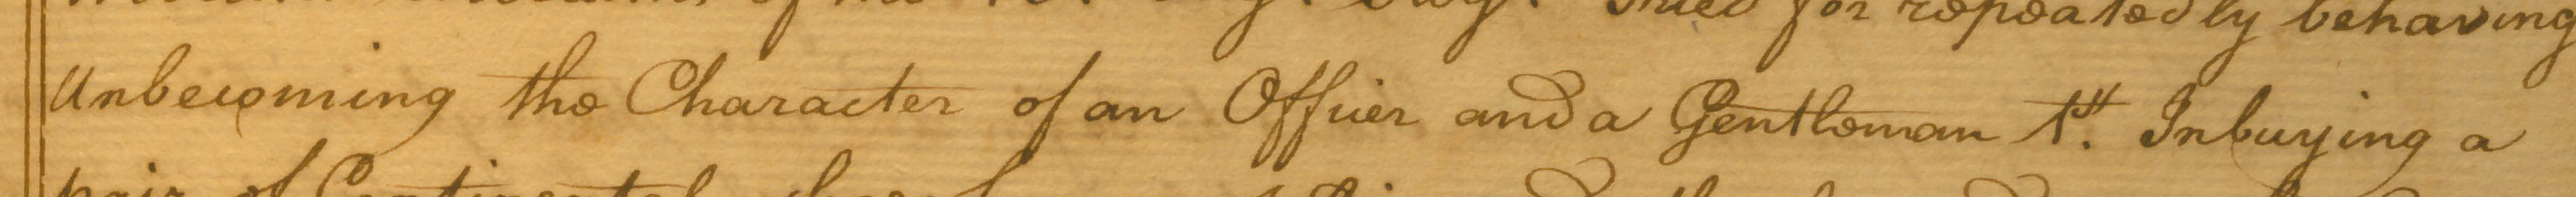unbecoming the Character of an Officer and a Gentleman 1^st. In buying a
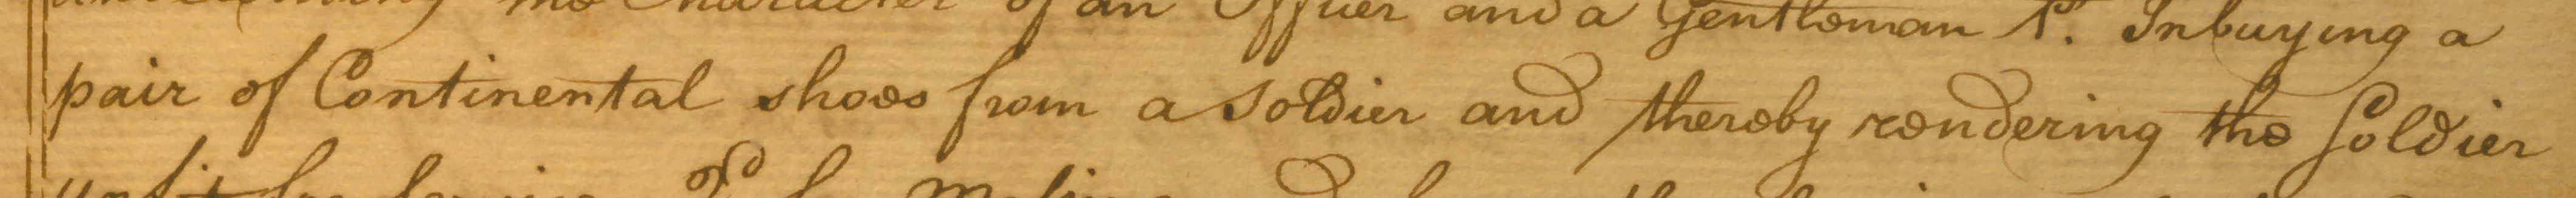pair of Continental shoes from a soldier and thereby rendering the Soldier
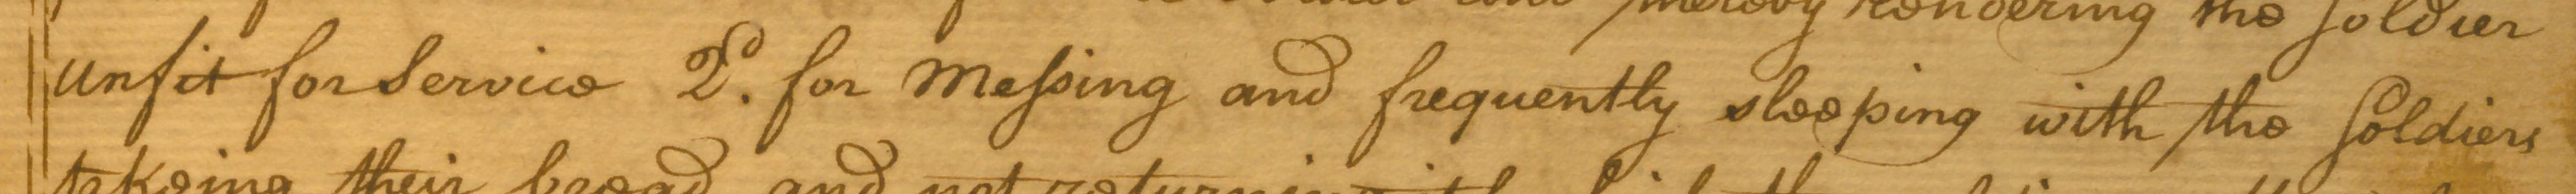unfit for Service 2^d. for messing and frequently sleeping with the Soldiers
